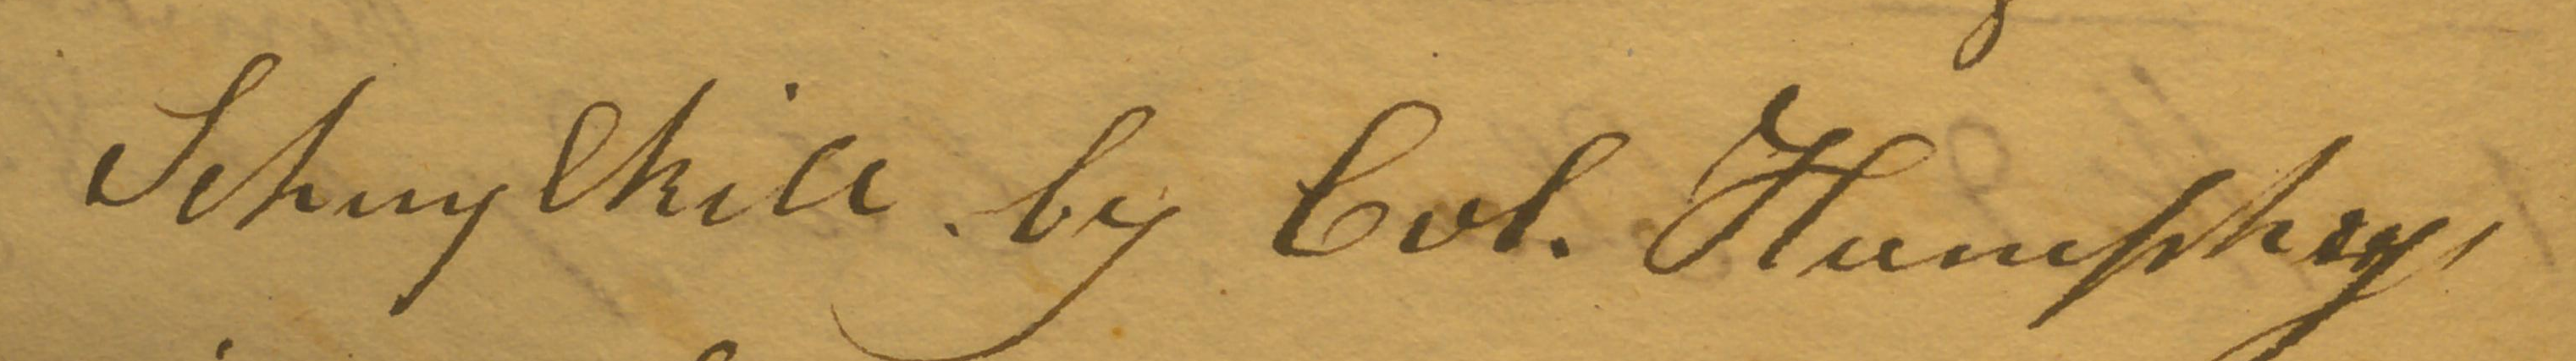Schuylkill by Col. Humphry,
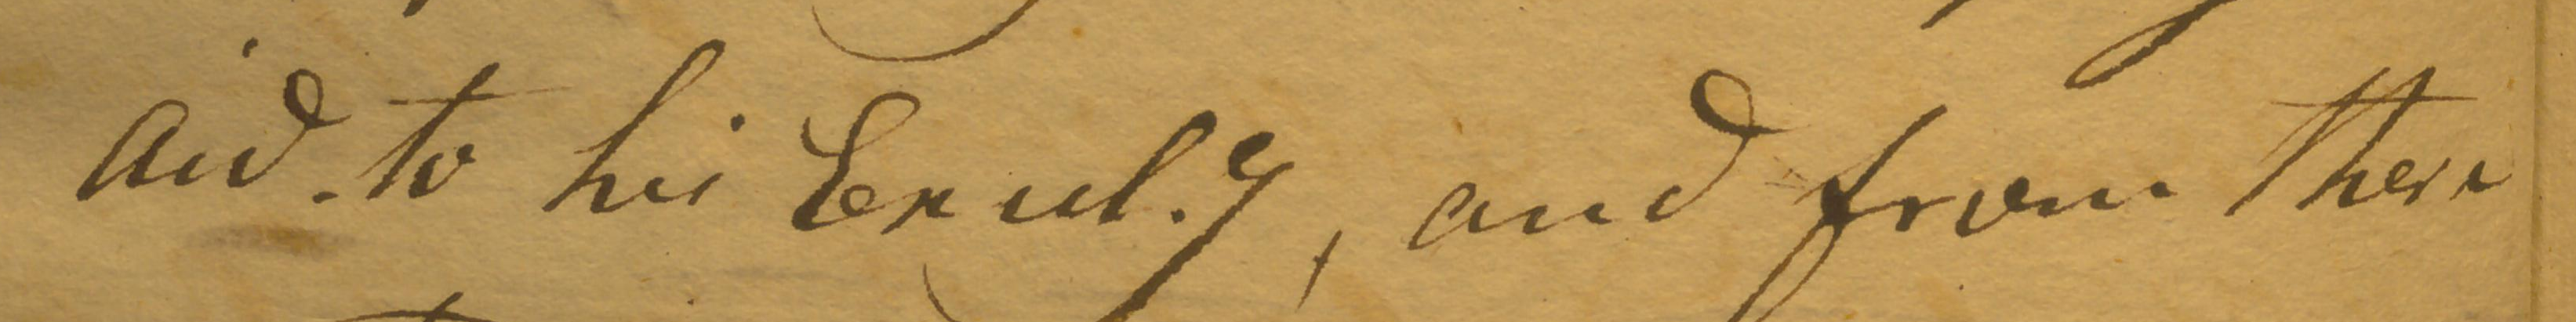Aid to his Excel^y., and from there
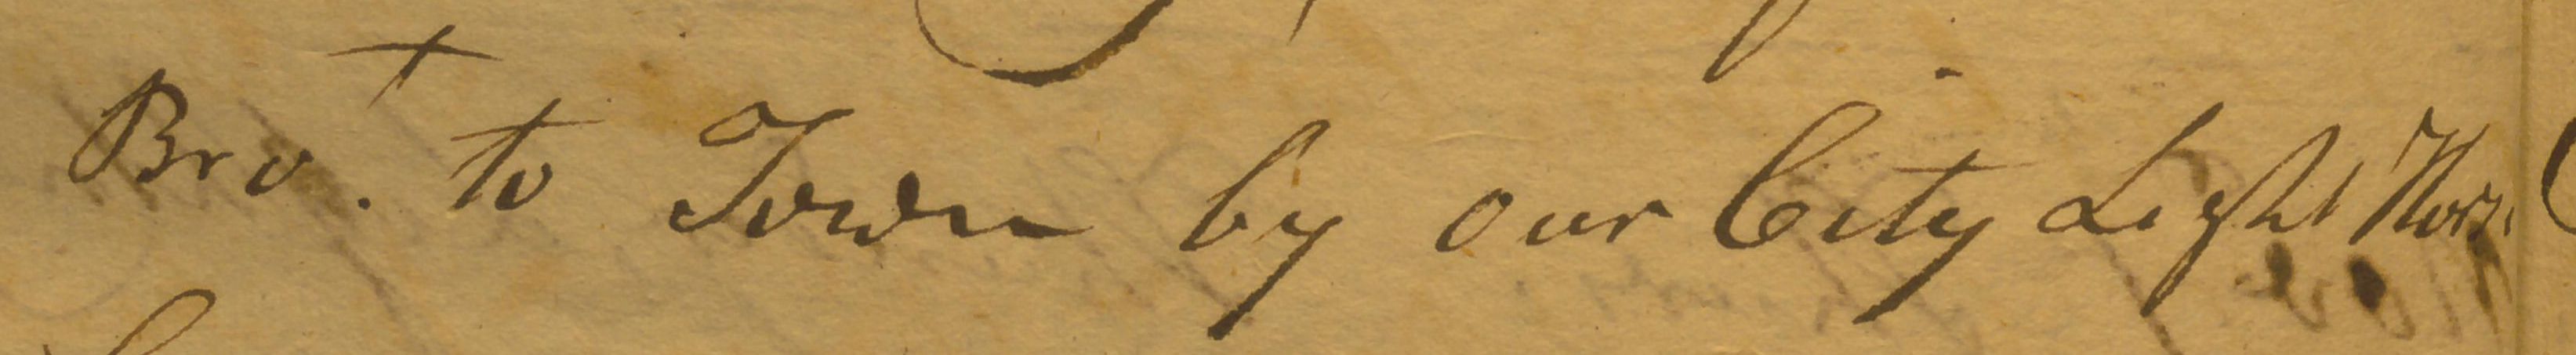Bro^t. to Town by our City Light Hors
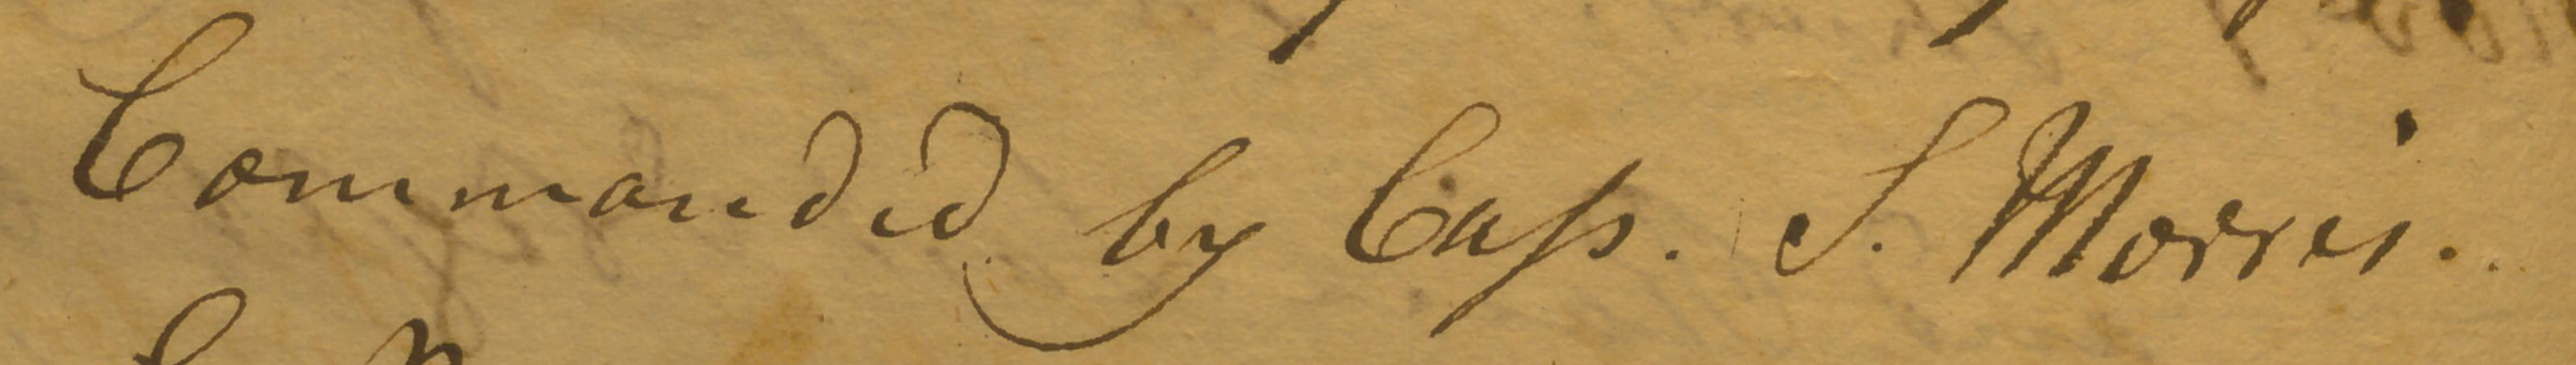Commanded by Cap. S. Morris.
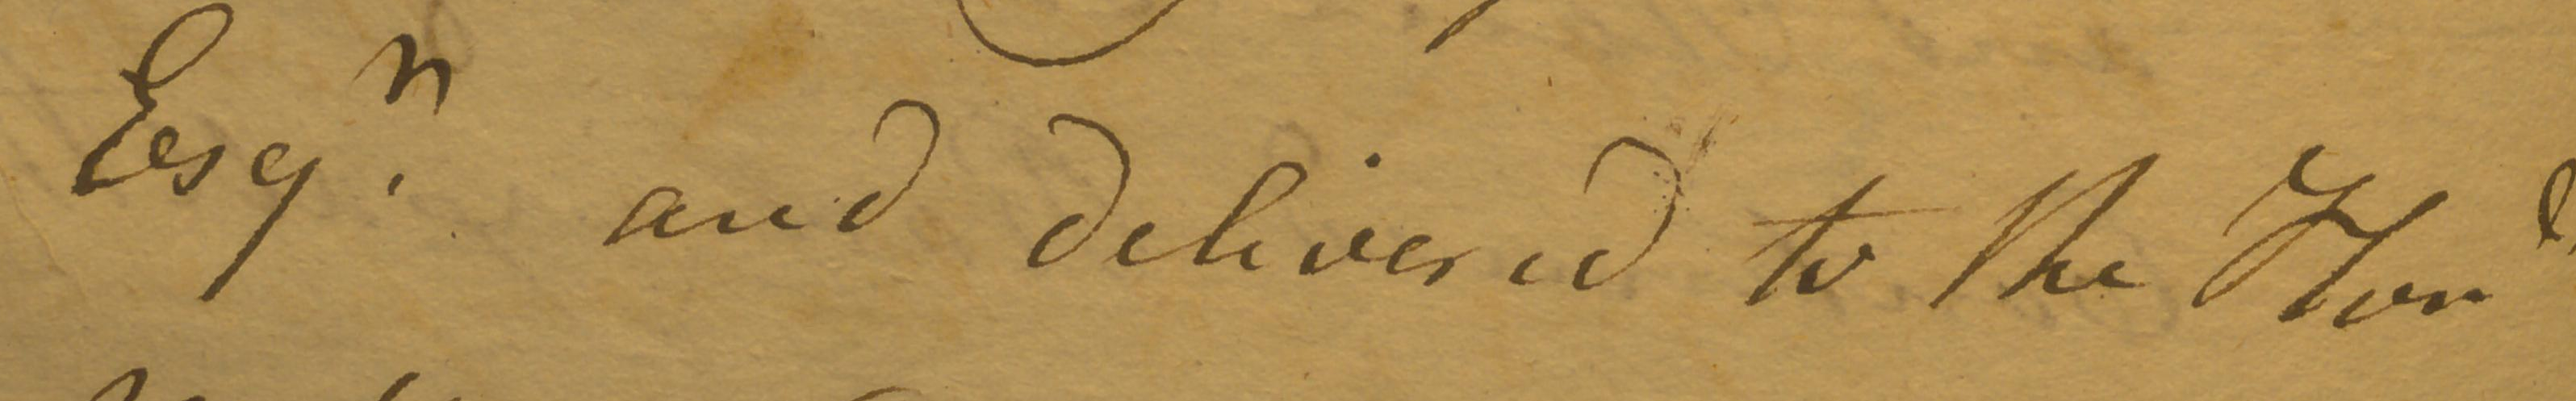Esq^r. and delivered to the Hon^l
